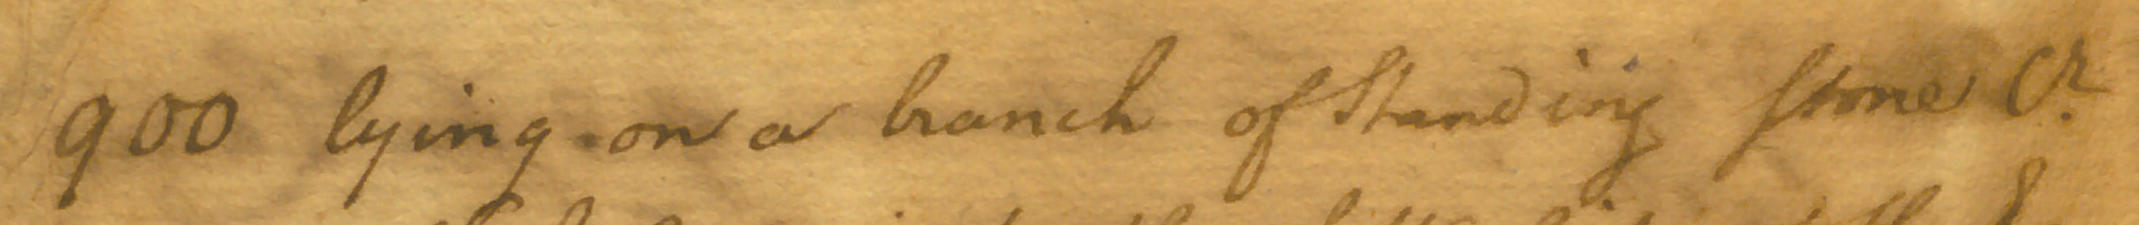900 lying on a branch of Standing Stone C^r.
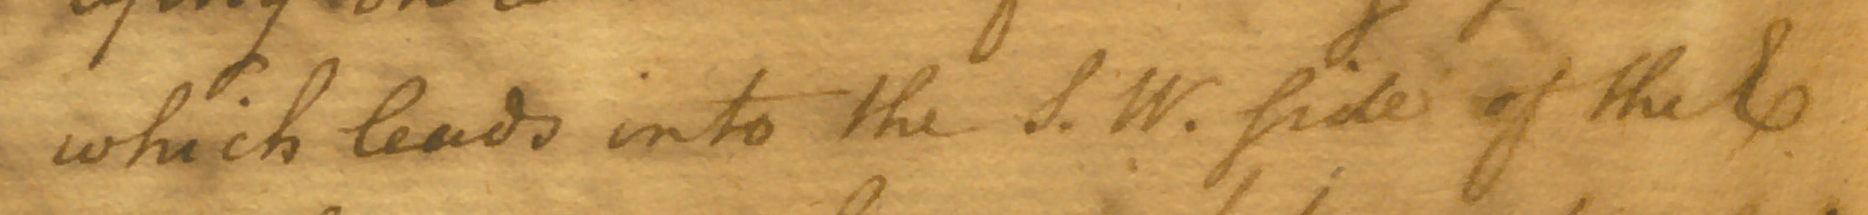which leads into the S.W. side of the E
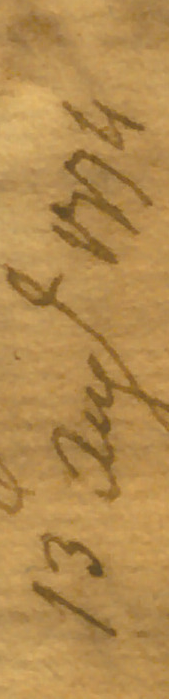13^th Aug^t 1774
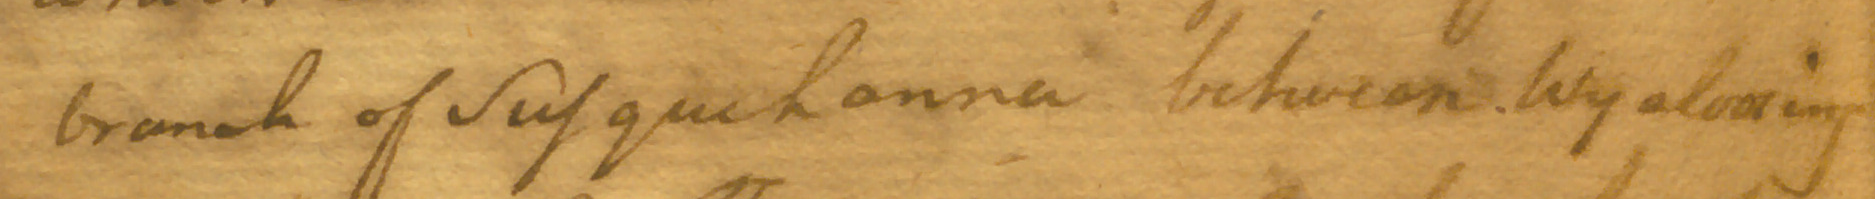branch of Susquehanna between Wyaloosing
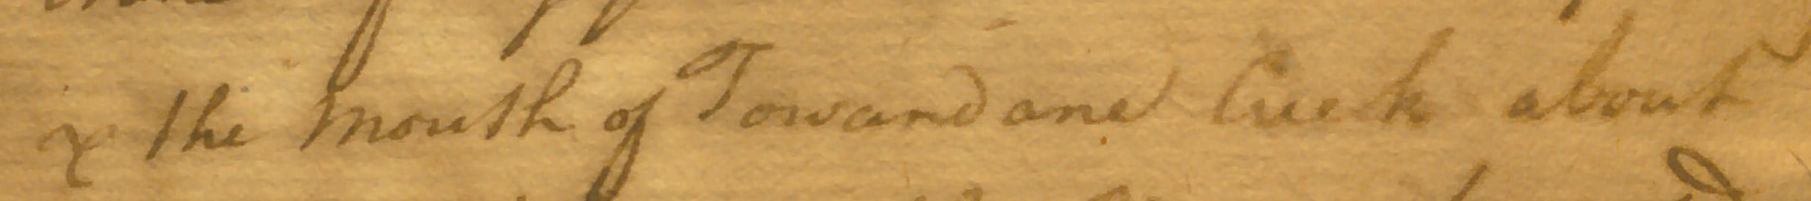& the mouth of Towandane Creek about
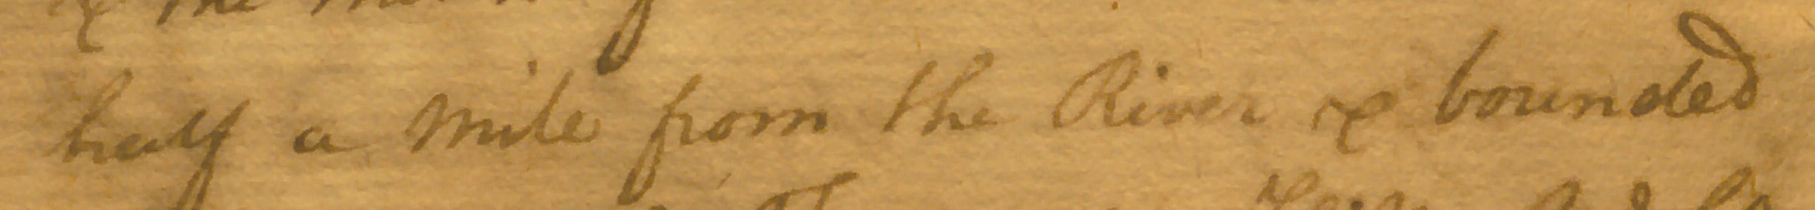half a mile from the River & bounded
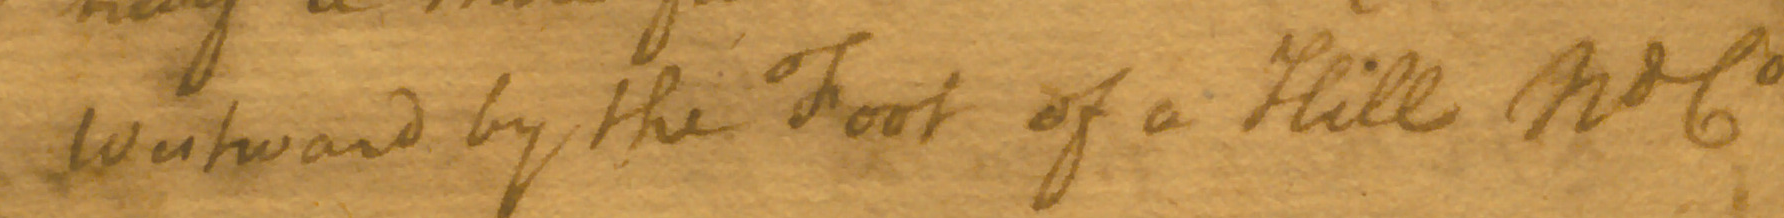westward by the Foot of a Hill N^d C^o
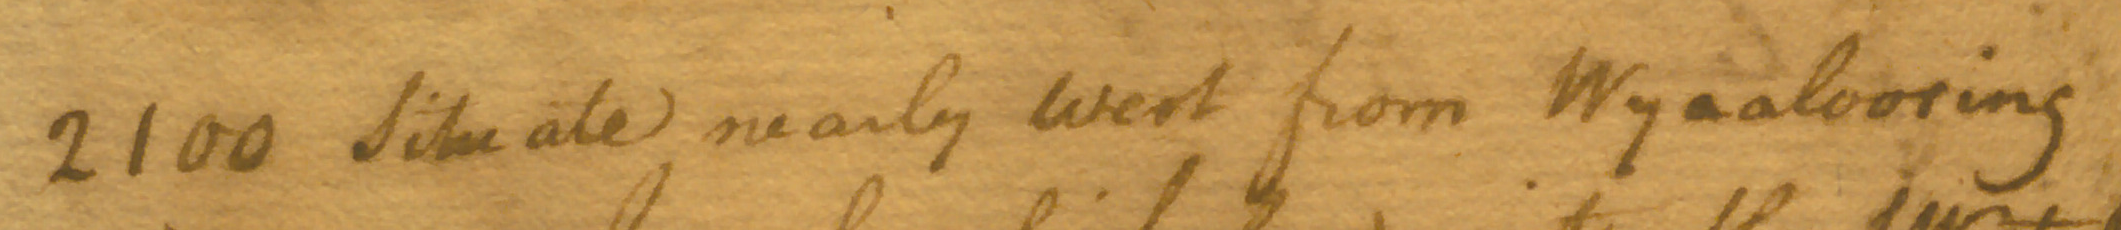2100 Situate nearly west from Wyaaloosing
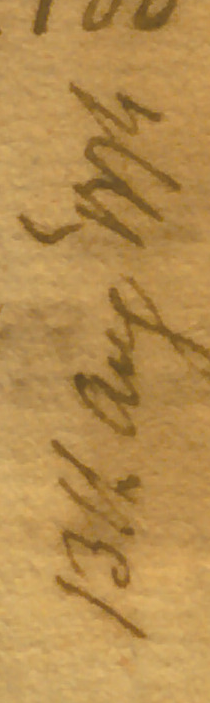13th Aug 1774
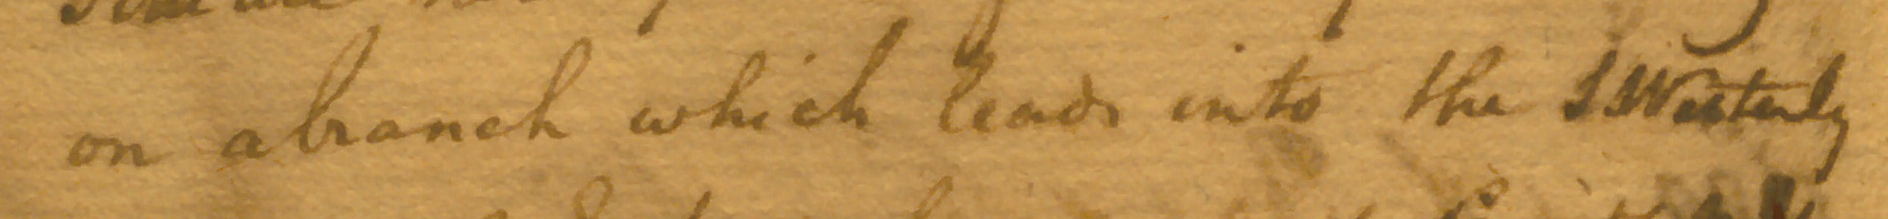on a branch which leads into the SWesterly
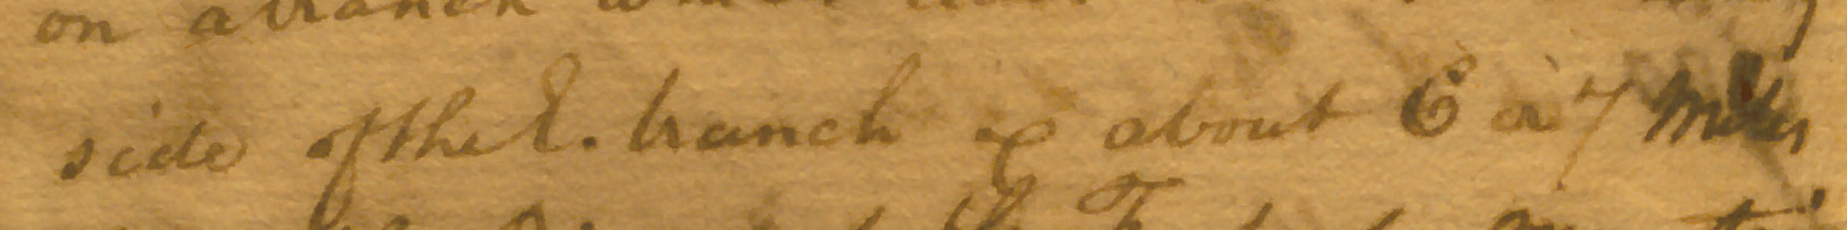side of the E. branch & about 6 or 7 miles
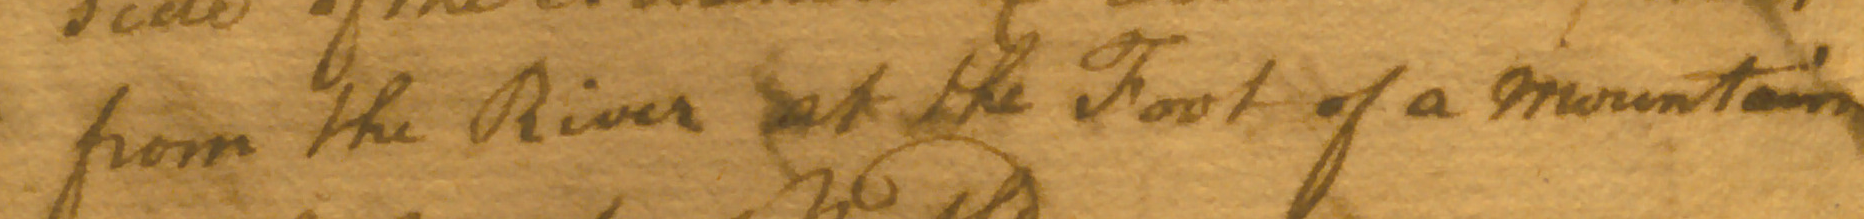from the River at the Foot of a mountain
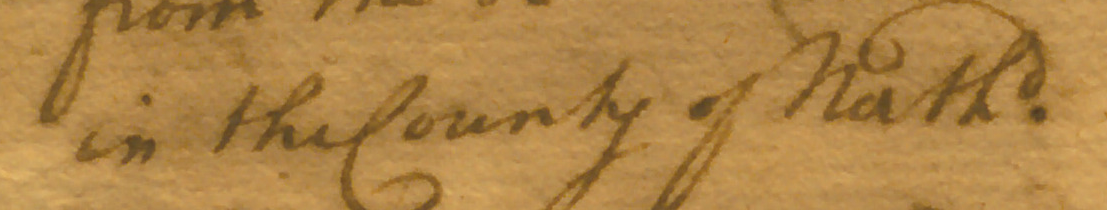in the County of North^d.
